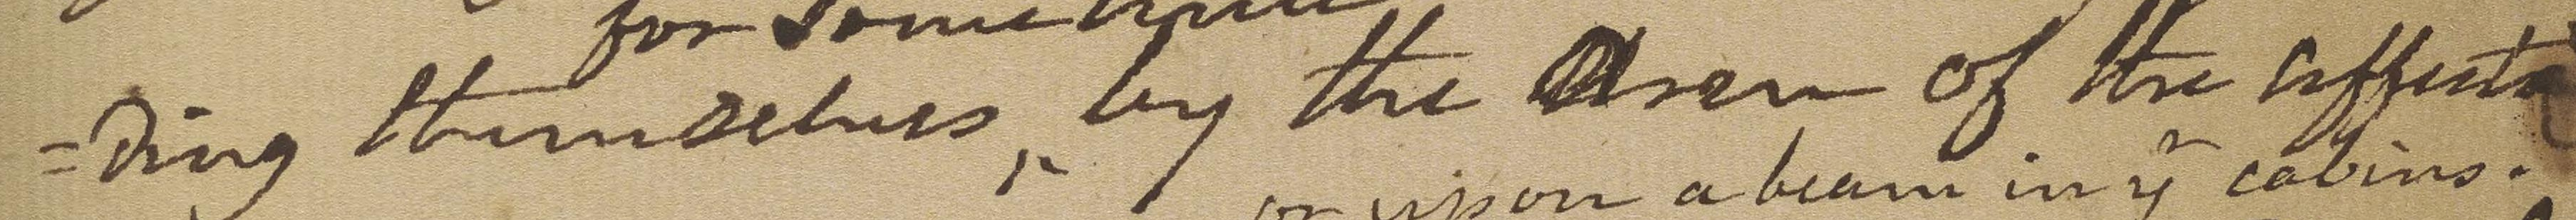-ding themselves ^ by the draw of the affecting
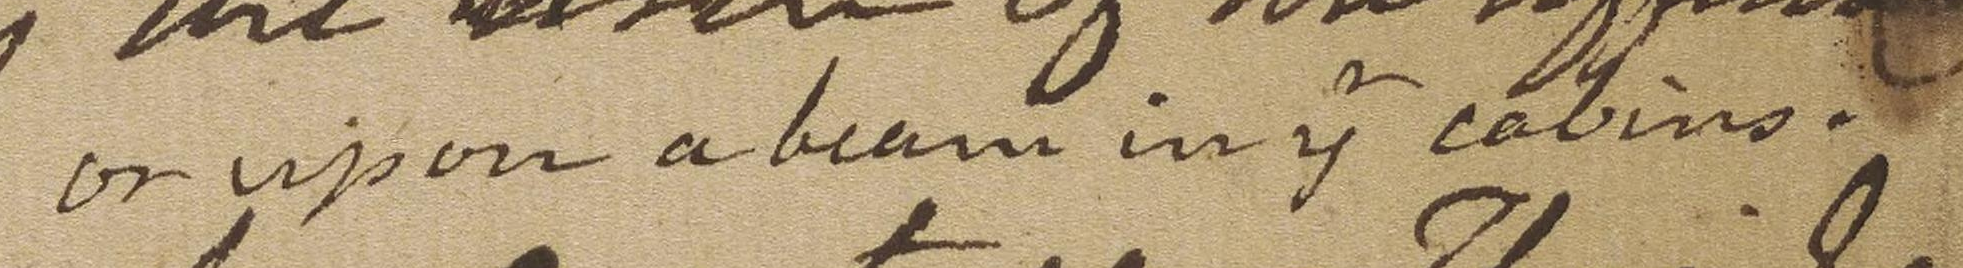or upon a beam in y^e cabins.
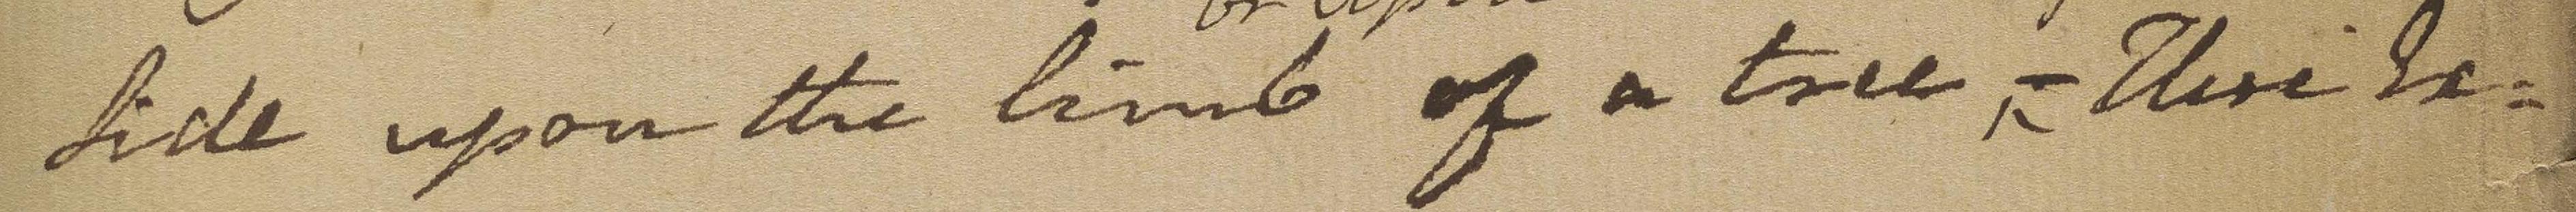side upon the limb of a tree ^ These Ex-
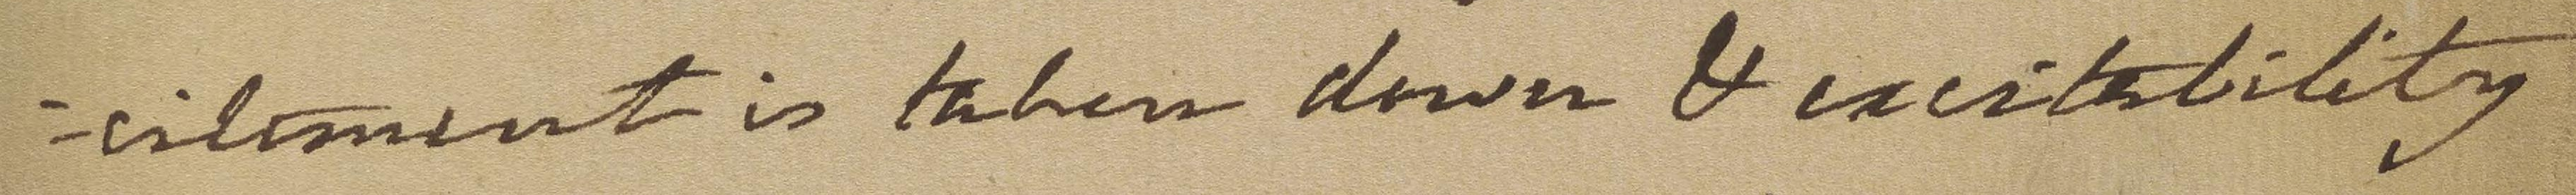-citement is taken down & excitability
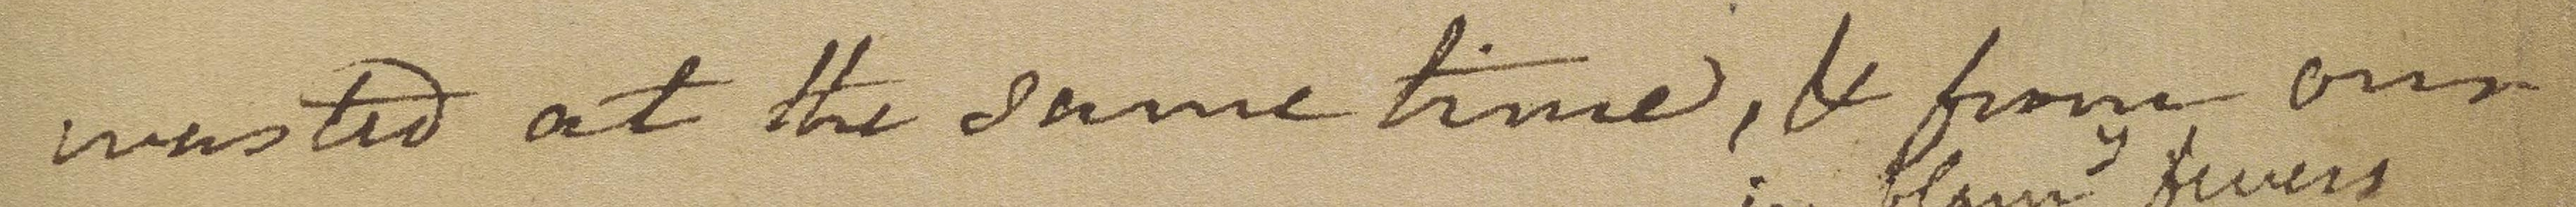wasted at the same time, & from our
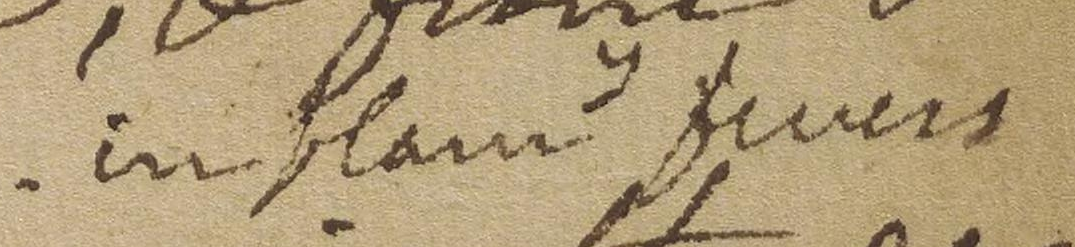inflam^y fevers
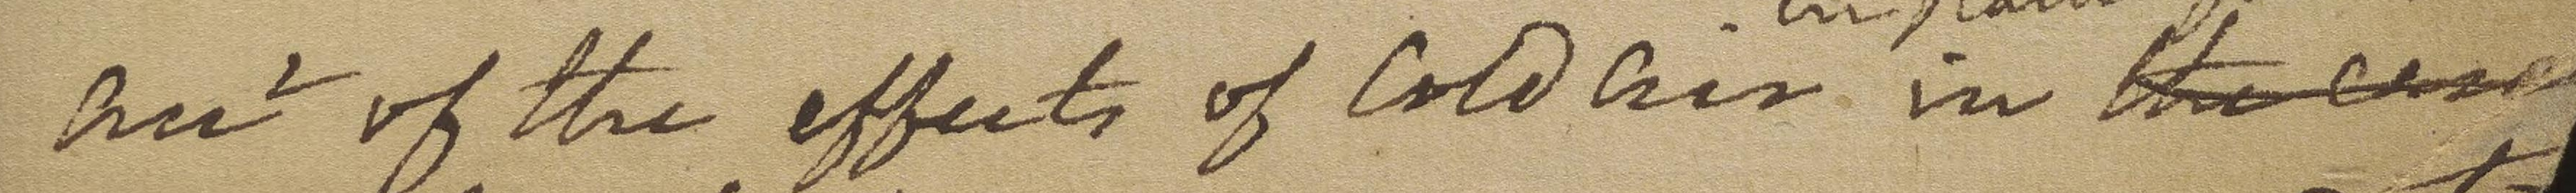Acc^t of the effects of cold air in [the case]
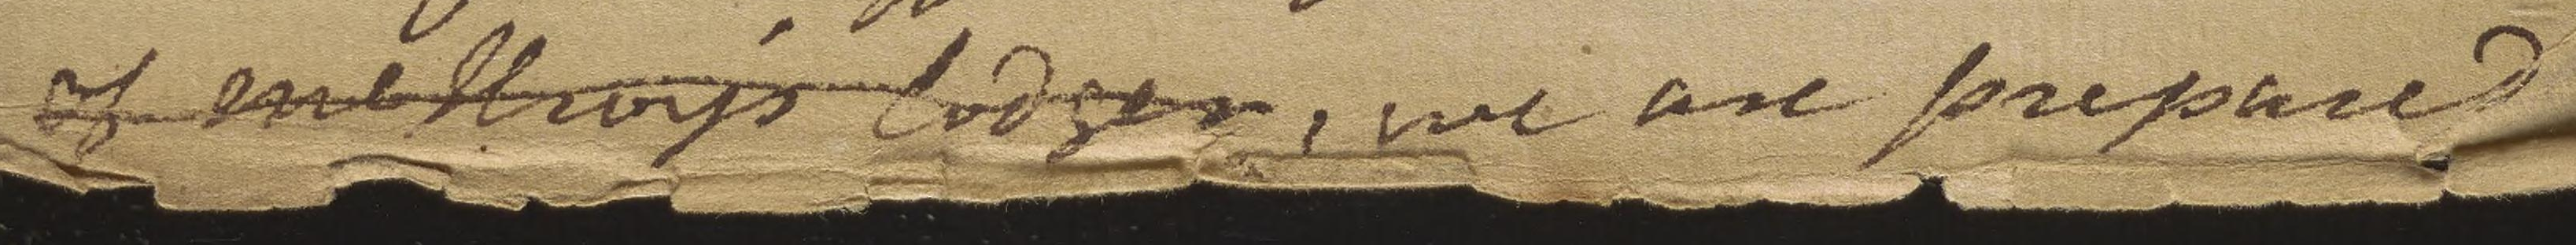[of ease Stroy's ledger] we are prepared
